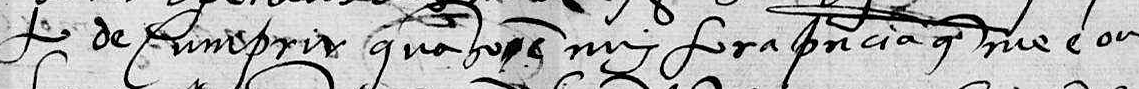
to de Cumprir quāto ē my fora pn̄cia q̄ me é ou
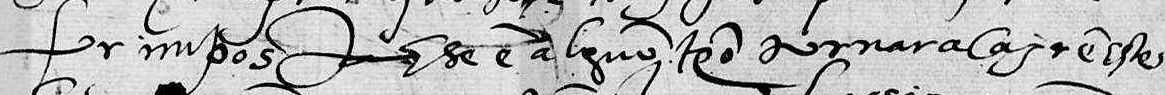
for imposta E se ē alguō tpō tornar a cajr ē Estes
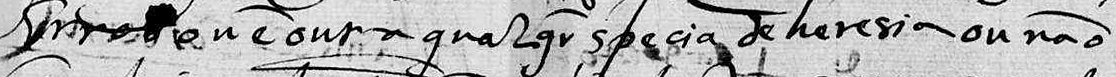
Erros ou ē outra qualq̄r specia de heresia ou não
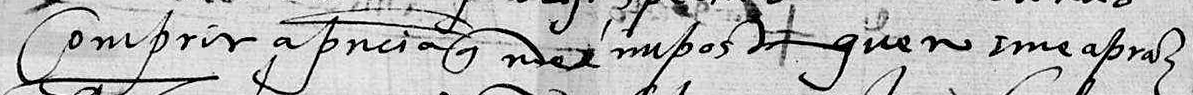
Comprir a pncia q̄ me é imposta quero E me apraz
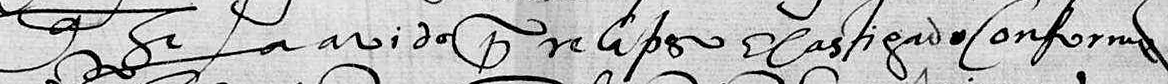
q̄ he Ja avido p̄o relapso E Castigado Conforme
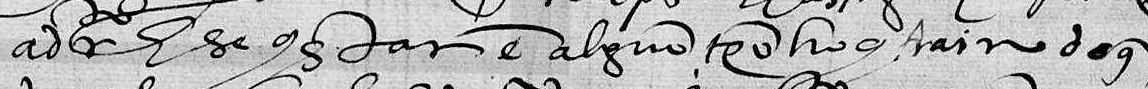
a drto E se ꝯstar ē algūo tpō ho ꝯtrairo do q̄
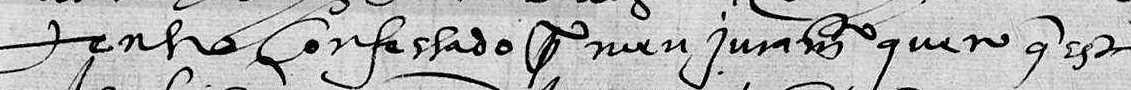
tenho Confessado p̄o meu Juramto quero q̄ Esta
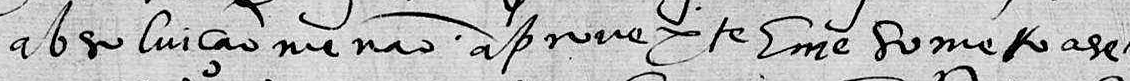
absoluição me não aproueyte E me sometto a se
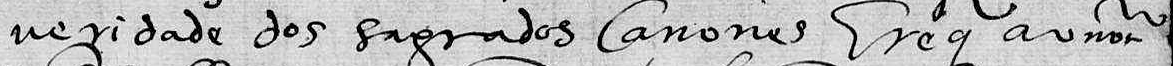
ueridade dos sagrados Canones E reqro ao notro
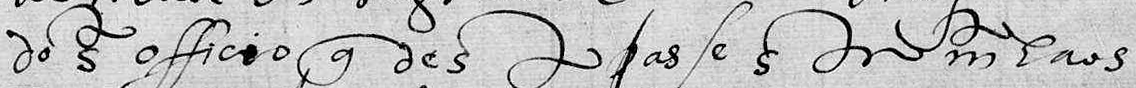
do sto officio q̄ desto passe stromto E aos
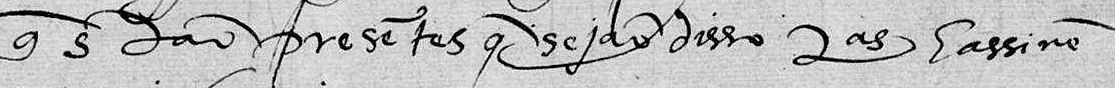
q̄ staõ presētes q̄ sejaõ disso tas E assinē
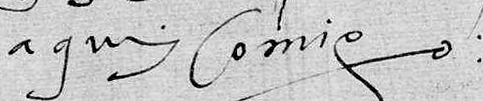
aquj Comigo
